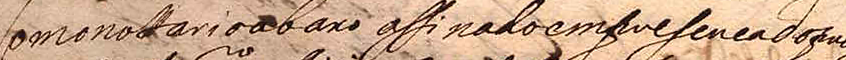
Com o nottario abaxo assinado em presença do pro
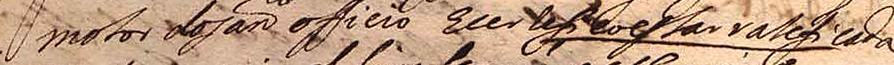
motor do santo officio E certefico estar rateficada
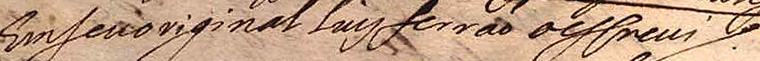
Em seu original luis ferraõ o esCreui/.
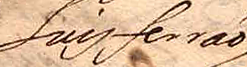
Luis ferraõ
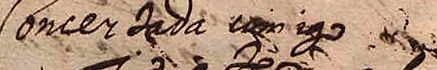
Concertada comigo
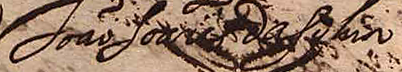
Joaõ Soares da Sylua
